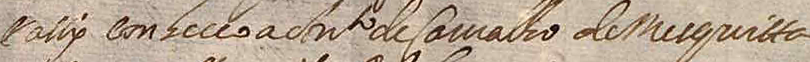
E assy conheceo a Anto de Carualho de Mesquitta
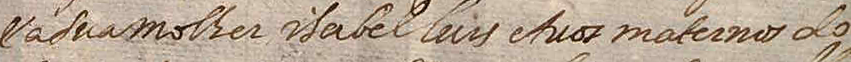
E a sua molher isabel luis Auos maternos do
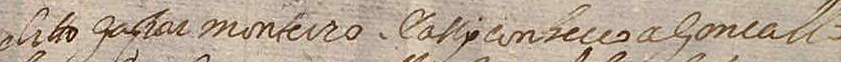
ditto gaspar monteiro E assy conheceo a Gonçallo
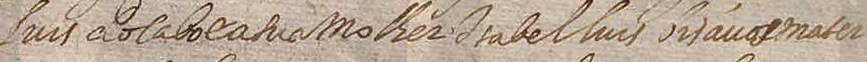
Luis do Cabo e a sua molher Isabel luis bisauos mater
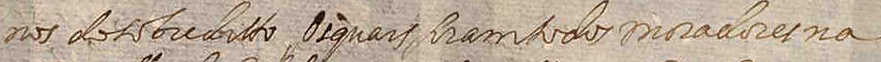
nos do sobreditto Os quais foram todos moradores na
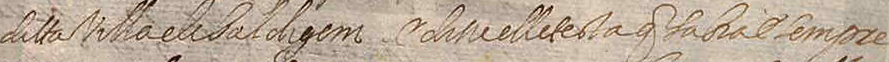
ditta villa de baldigem E disse elle testa q̄ sabia e sempre
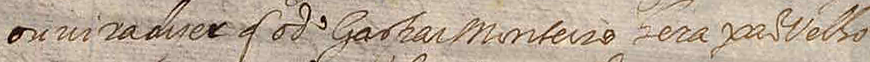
ouuira dizer q̄ o do Gaspar Monteiro hera xaõ velho
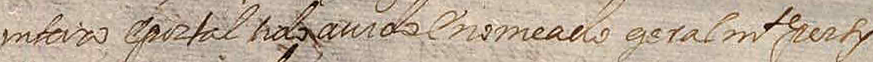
inteiro e por tal tido auido E nomeado geralmte per sy
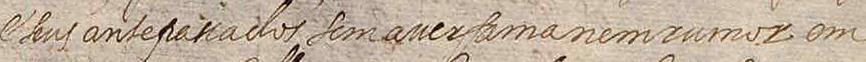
E seus antepassados sem auer fama nem rumor em
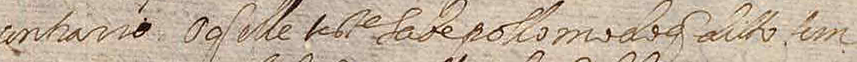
contrario O q̄ elle testa sabe pollo modo q̄ ditto tem
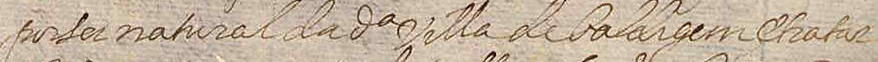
por ser natural da da Villa de baldigem E tratar
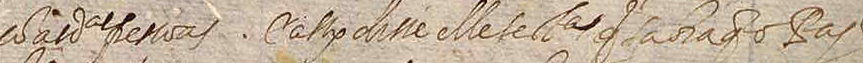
cō as das pessoas. E assy disse elle testa q̄ sabia q̄ o Paj
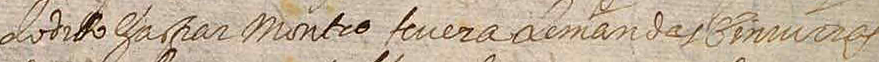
do ditto Gaspar Montro teuera demandas E iniurias
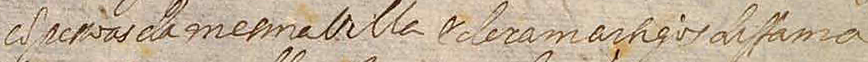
cō pessoas da mesma Villa e deram artigos diffama
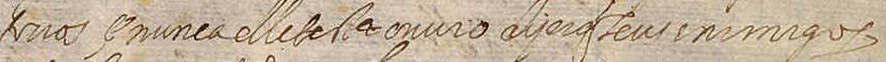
torios, E nunca elle testa ouuio dizer q̄ seus enimigos
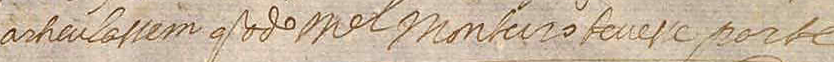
articulassem q̄ o do Mel Monteiro teuesse parte
